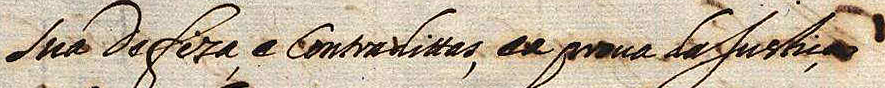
sua defeza, e Contradittas, e a proua da Justiça
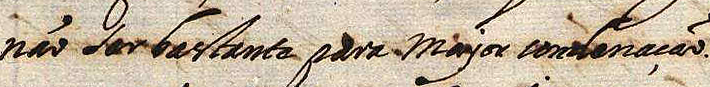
naõ ser bastante para mayor condenaçaõ.
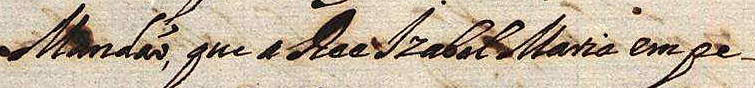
Mandaõ, que a Ree Izabel Maria em pe
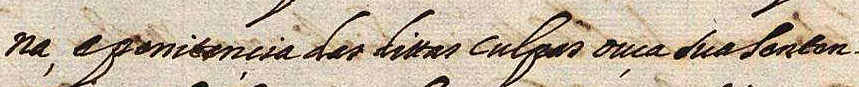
na, e penitençia das dittas culpas ouça sua senten
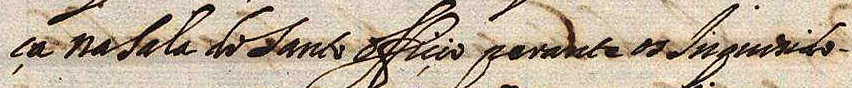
ça na Sala do Santo offiçio perante os Inquisido
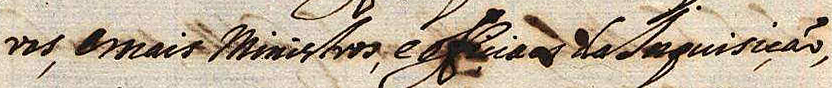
res, e mais Ministros, e officiaes da Inquisiçaõ,
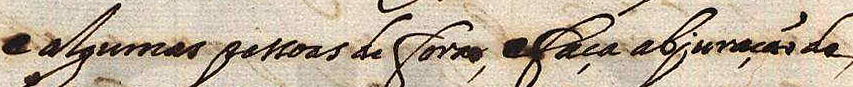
e algumas pessoas de fora, e faça abjuraçaõ de
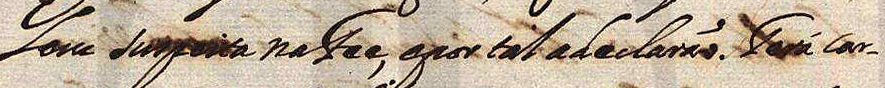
Leue suspeita na Fee, e por tal a declaraõ. Terá car
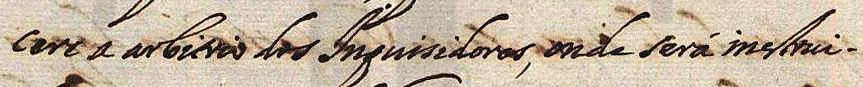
cere a arbitrio dos Inquisidores, onde será instrui
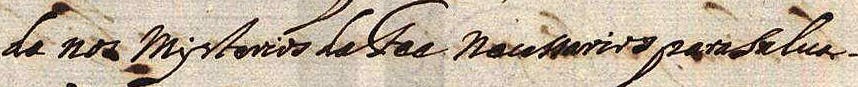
da nos Mysterios da Fee necessarios para salua
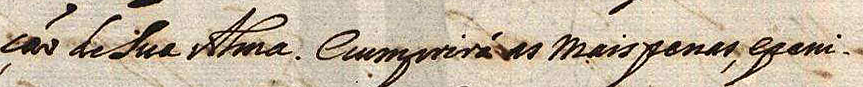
çaõ de Sua Alma. E cumprirá as mais penas, e peni
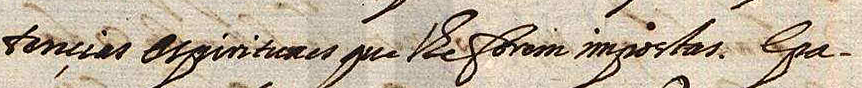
tençias espirituaes que lhe forem impostas. E pa
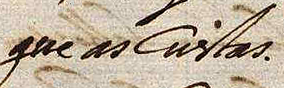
gue as Custas.
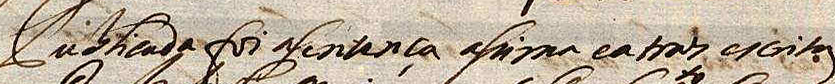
Publicada foi a sentença assima e atras escrita
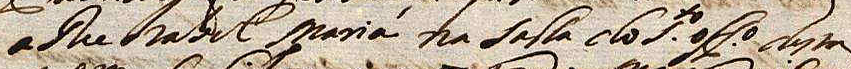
a Ree Izabel maria na salla do s.to off.o desta
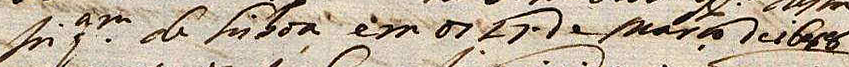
Jnqam. de Lisboa, em os 17. de março de i688.
